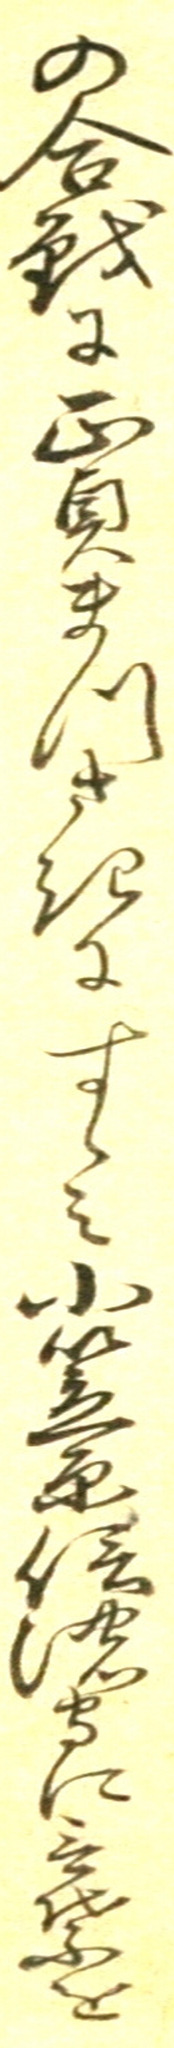の合戦に正貞まつさきにすゝみ小笠原信濃守に言葉を
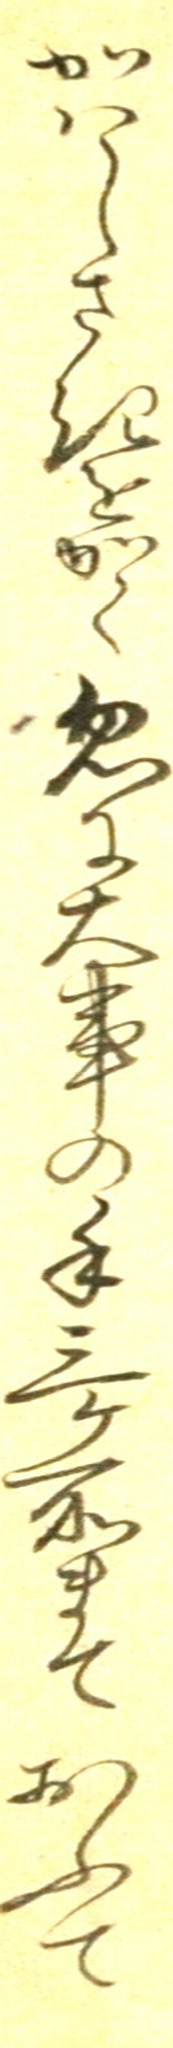かはしさきをかく忽に大事の手三ヶ所まておふて
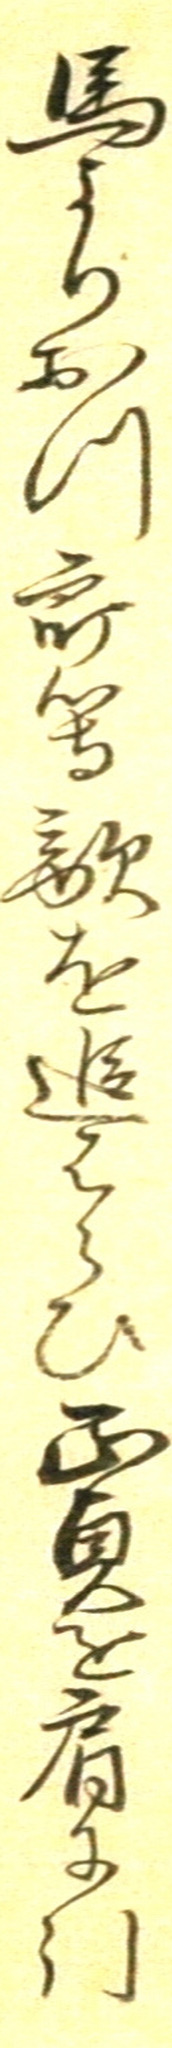馬よりおつ郎等敵を追はらひ正貞を肩に引
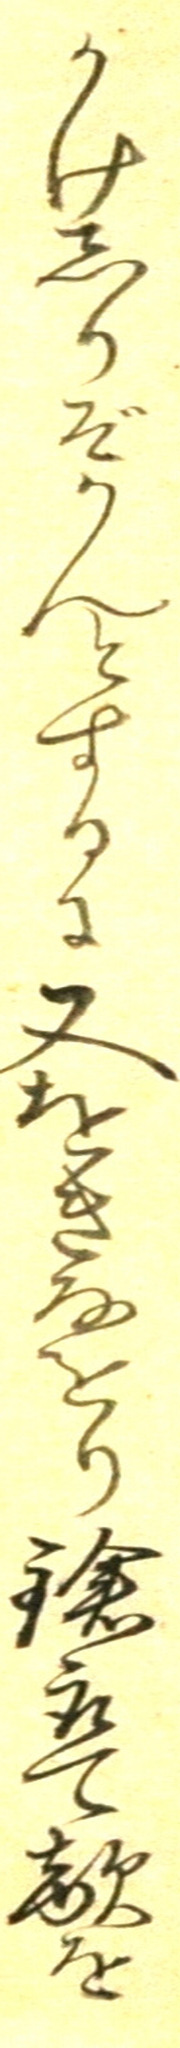かけしりぞかんとするに又をきなをり鎗取て敵を
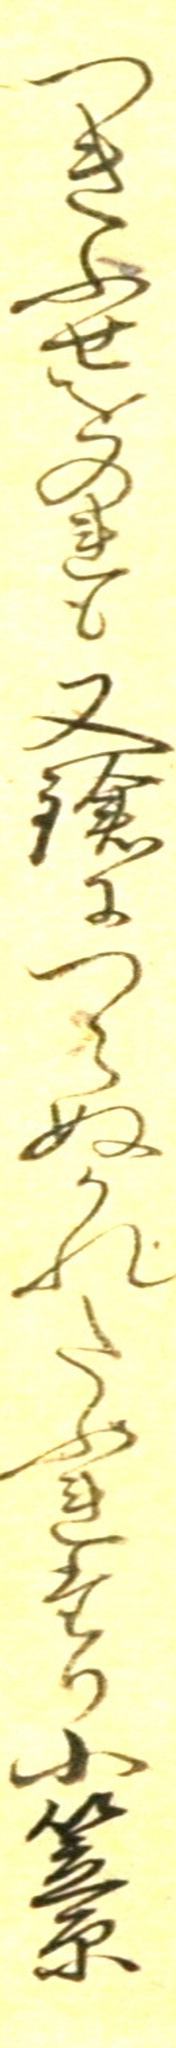つきふせをのれも又鎗につらぬかれたふれたり小笠原

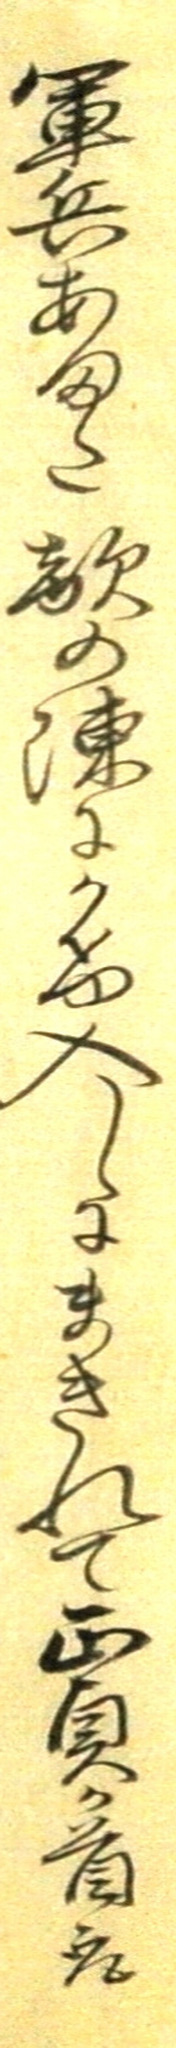軍兵あまた敵の陣にかけ入しにまきれて正貞か首取
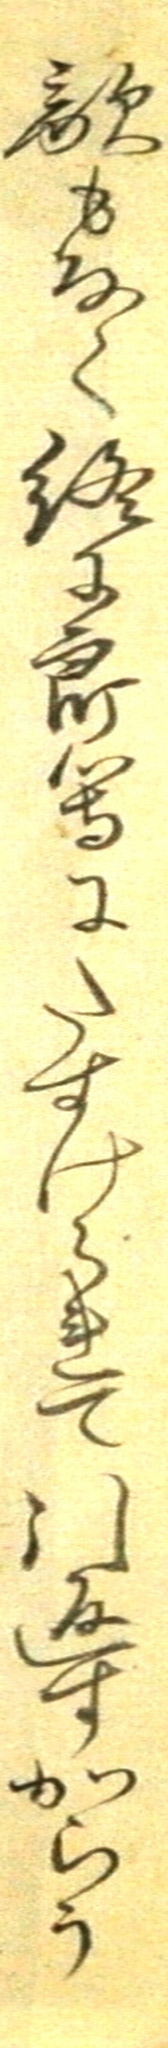敵もなく終に郎等にたすけられて引返すからう
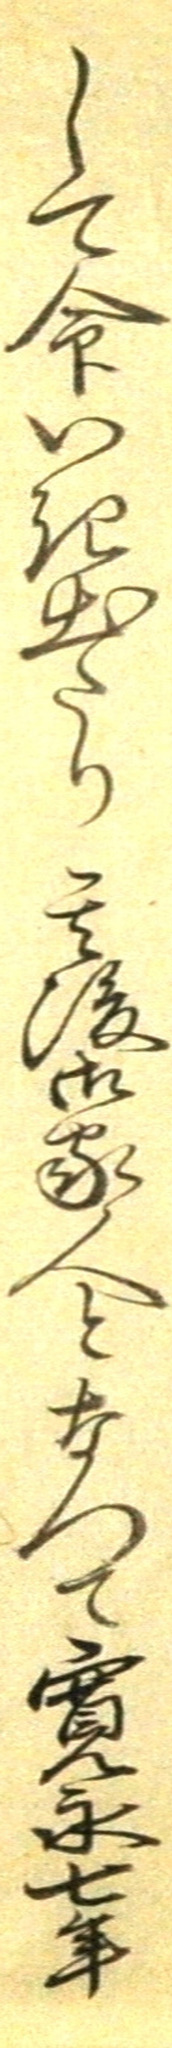して命いき出たり其後御家人となつて寛永七年
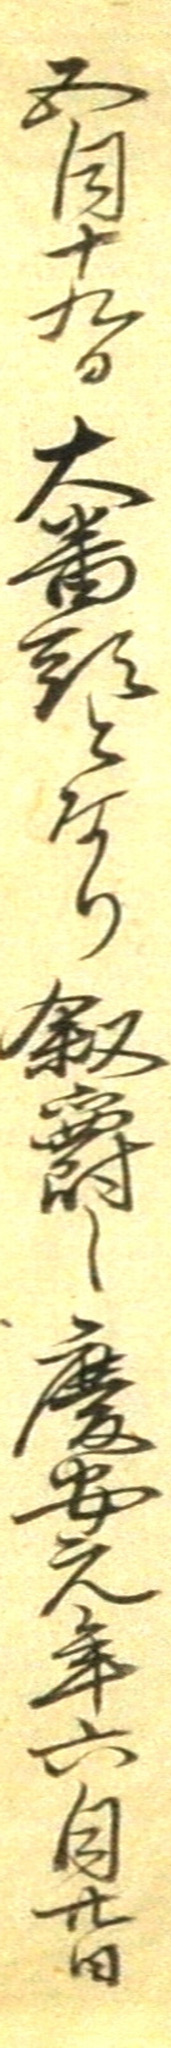五月十九日大番頭となり叙爵し慶安元年六月廿日
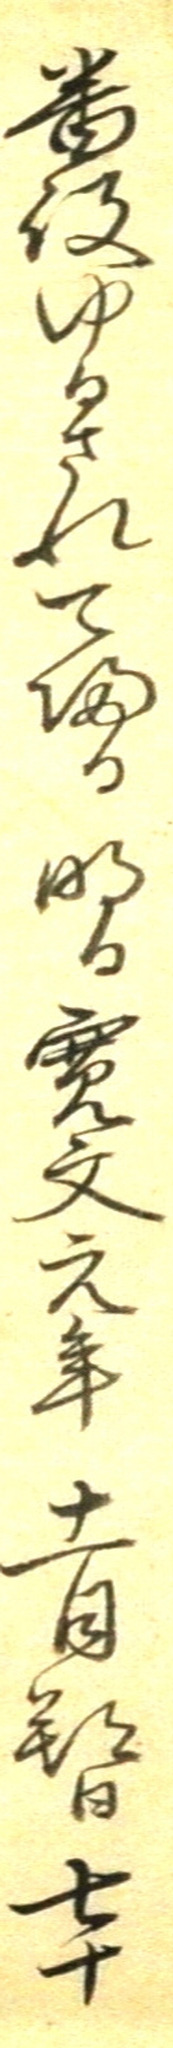番役ゆるされて帰る明る寛文元年十一月朔日七十
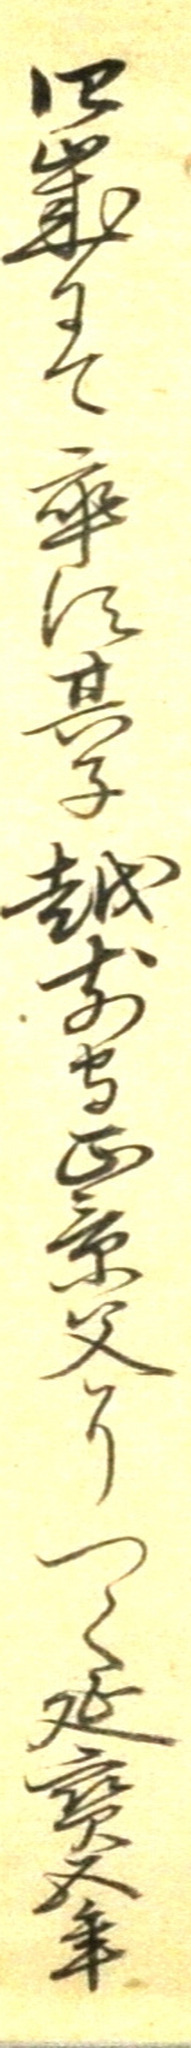四歳にて卒す其子越前守正景父につく延享五年
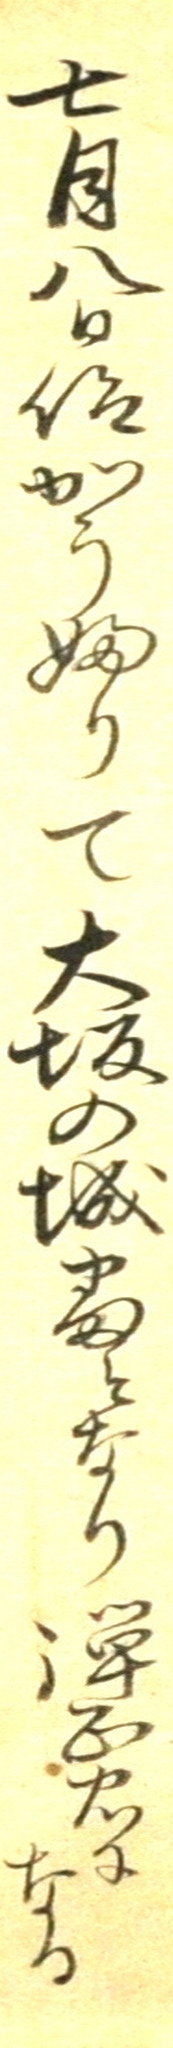七月八日仰かうふりて大坂の城番となり弾正忠になる
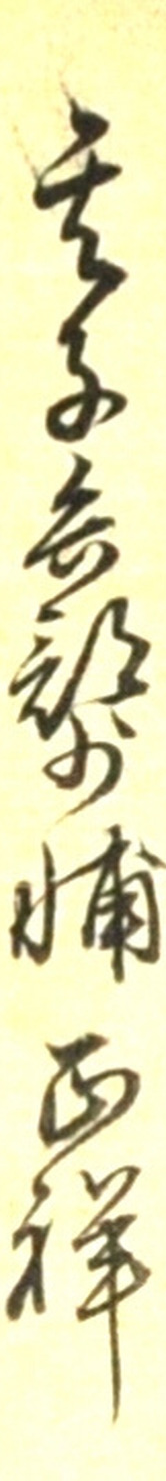其子兵部少輔正祥
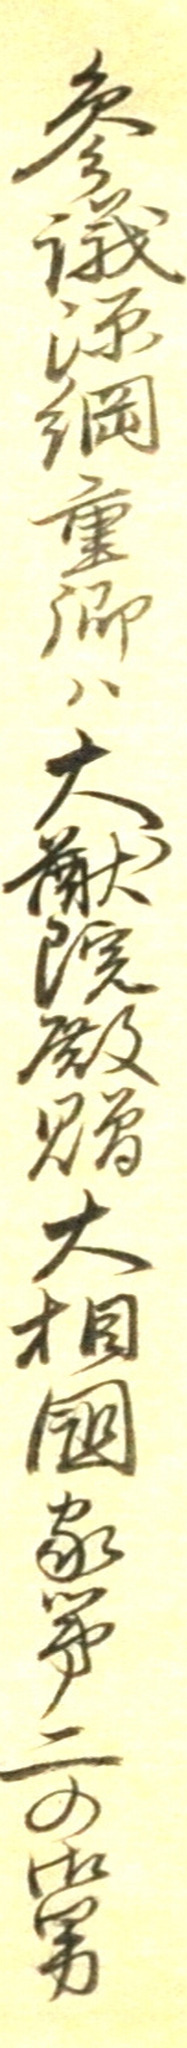参議源綱重卿は大猷院殿贈大相国家第二の御男
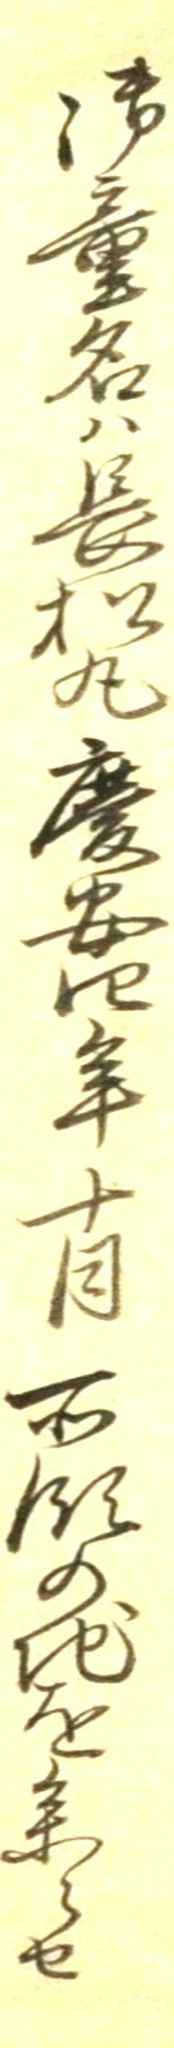御童名は長松丸慶安四年十月所領の地を参らせ
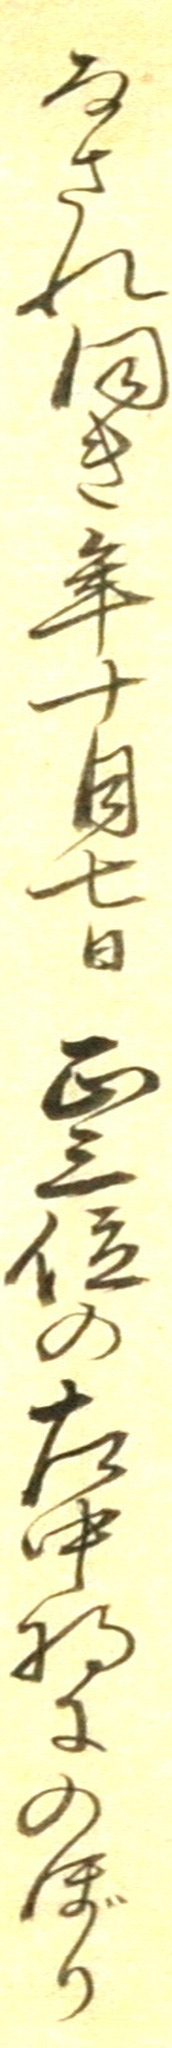なされ同き年十月七日正三位の左中将にのぼり
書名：藩翰譜（一）
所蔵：伊那市立高遠町図書館・合同会社AMANE
